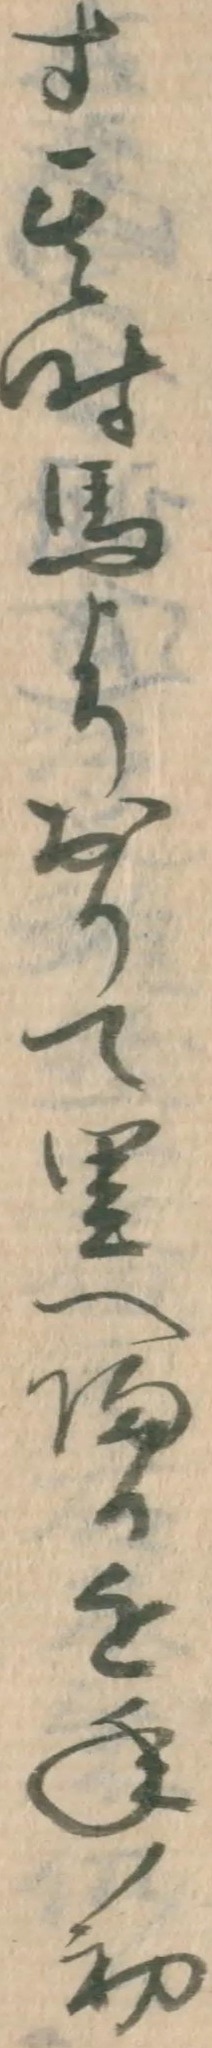す其時馬よりおりて里へ帰る近年ノ初
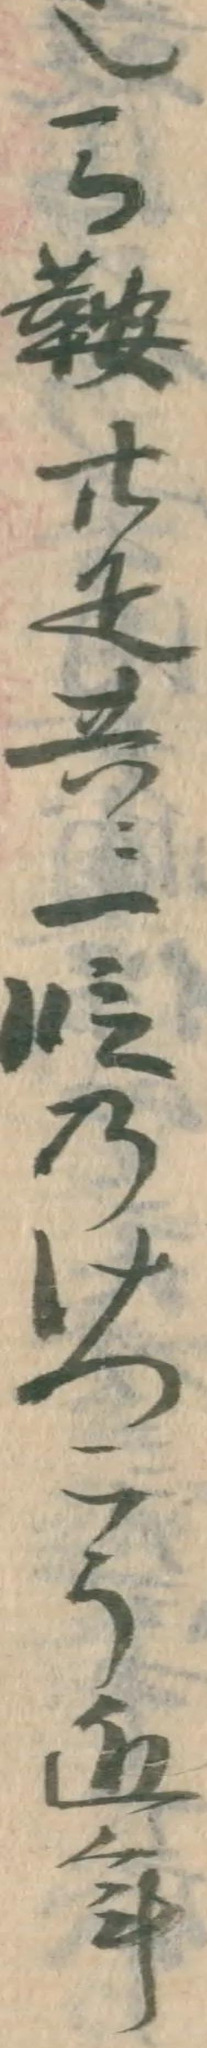也馬鞍廿疋共ニ一段のけつこう近年
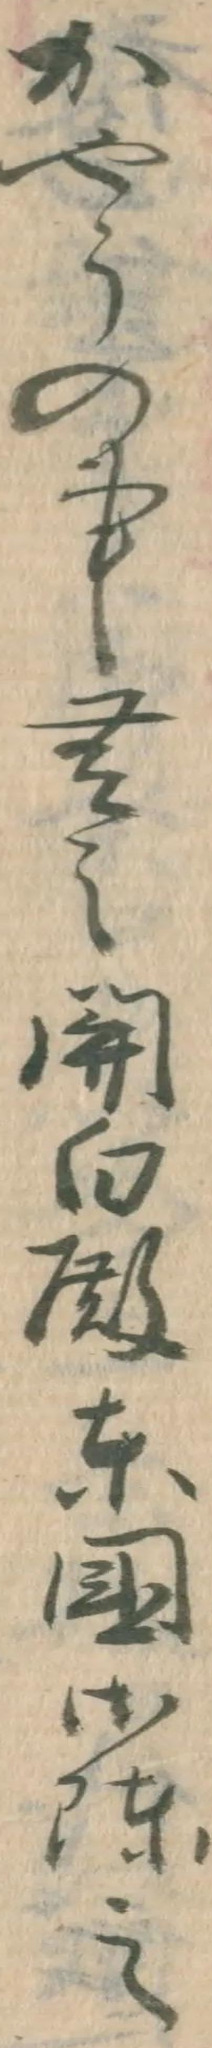かやうの事無之関白殿東国御陣之
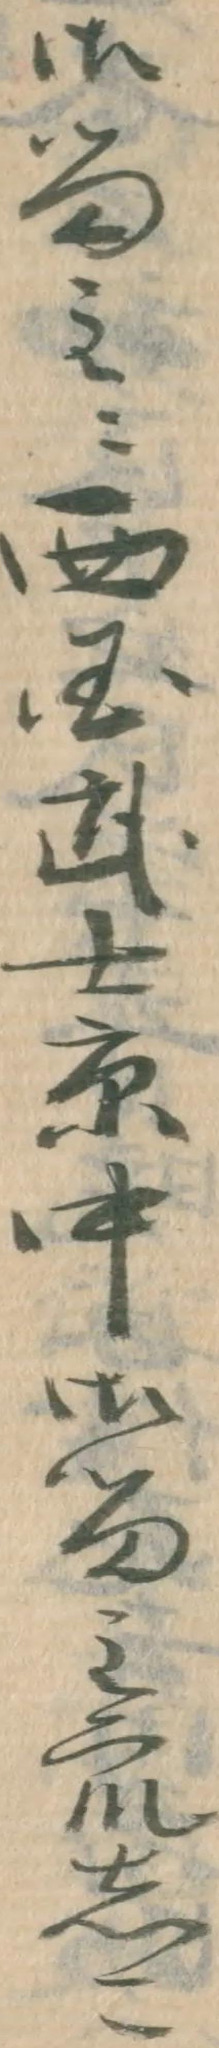御留主ニ西国武士京中御留之衆しこ
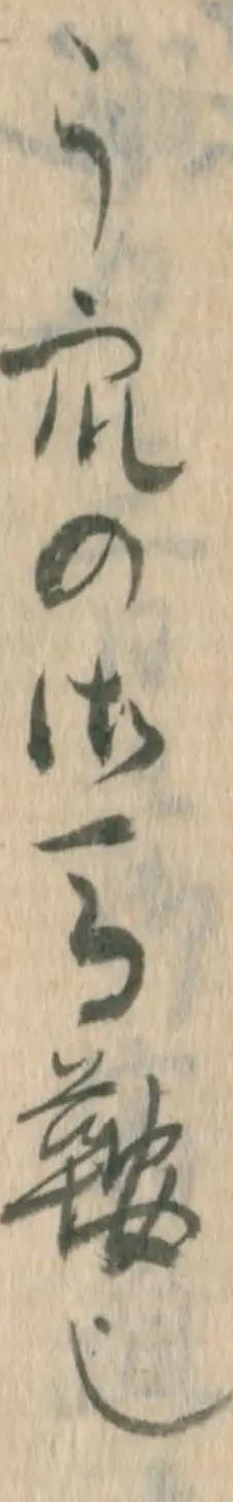う衆の御馬鞍也
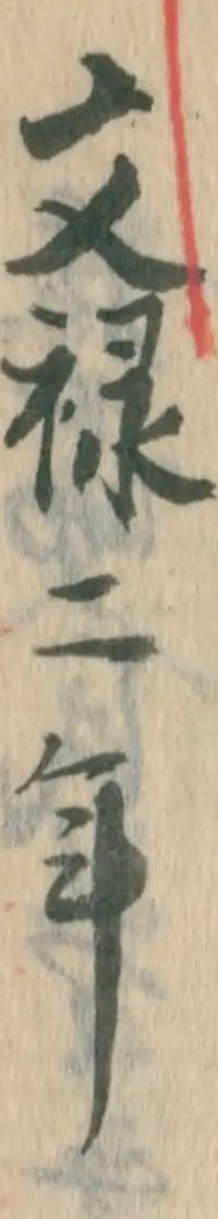文禄二年
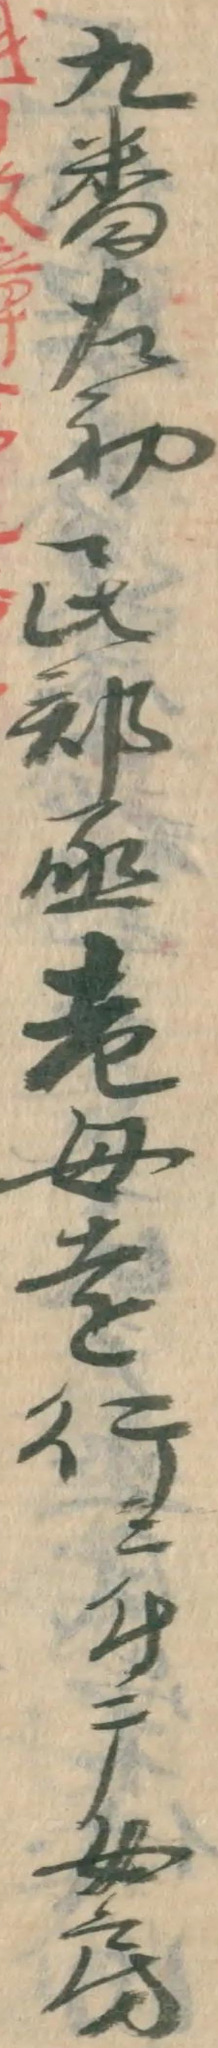九番左初民部丞老母遠行ニ付テ女房
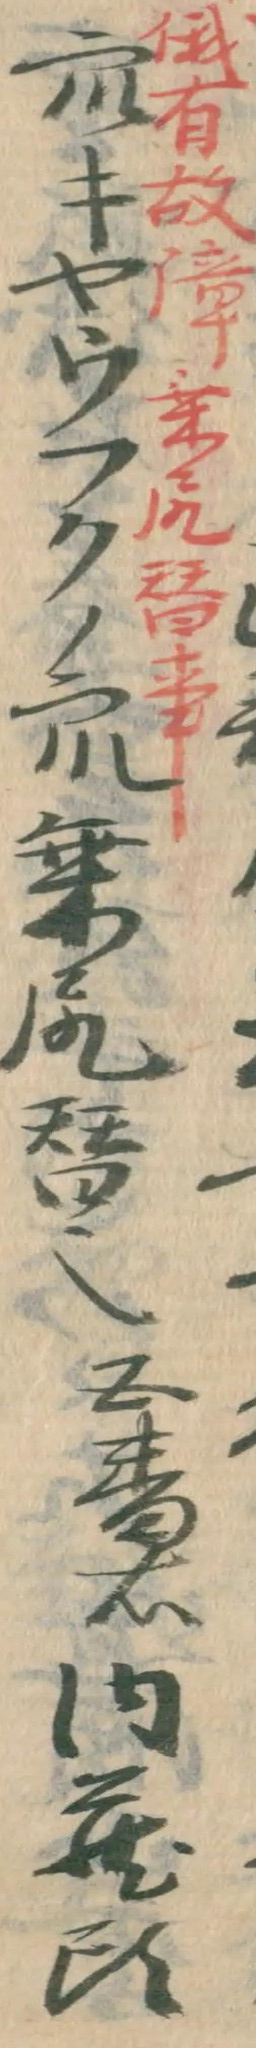衆キヤウフクノ衆乗尻替也五番右内蔵頭

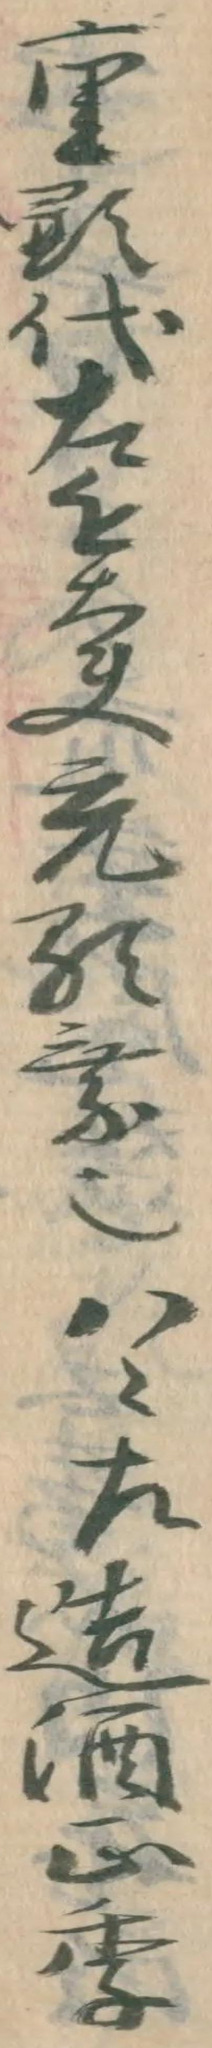重顕代左近大夫充顕乗也八郎左造酒正季
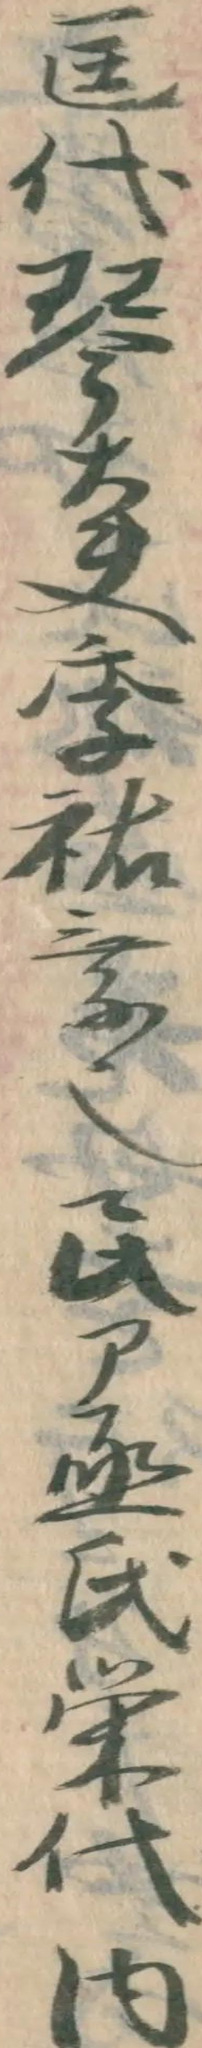匡代琴大夫季祐乗也民部丞氏栄代内
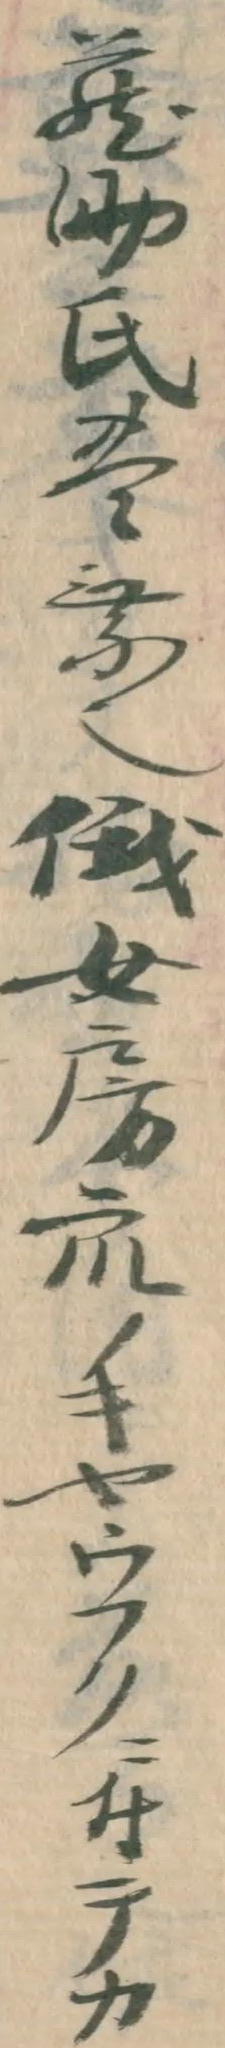蔵助氏豊乗也俄女房衆ノキヤウフクニ付テカ
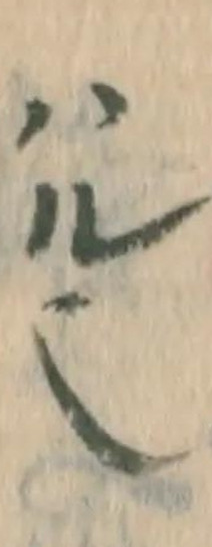ハル也
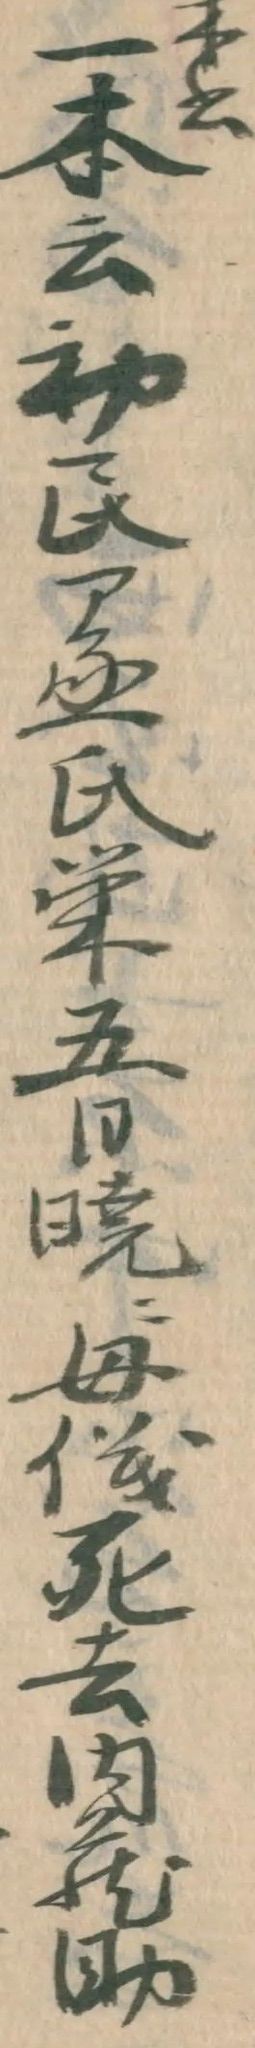一本云初民部丞氏栄五日暁ニ母儀死去内蔵助
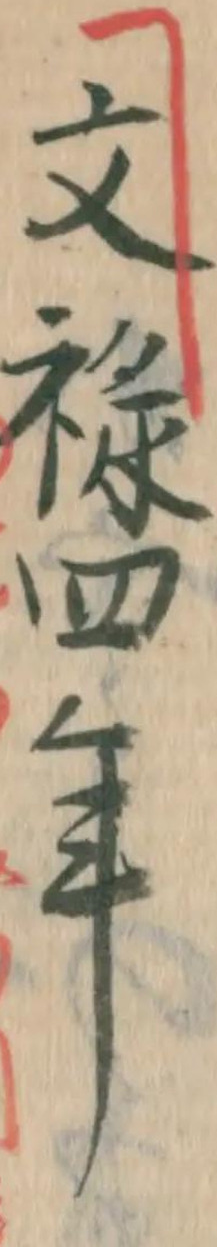文禄四年
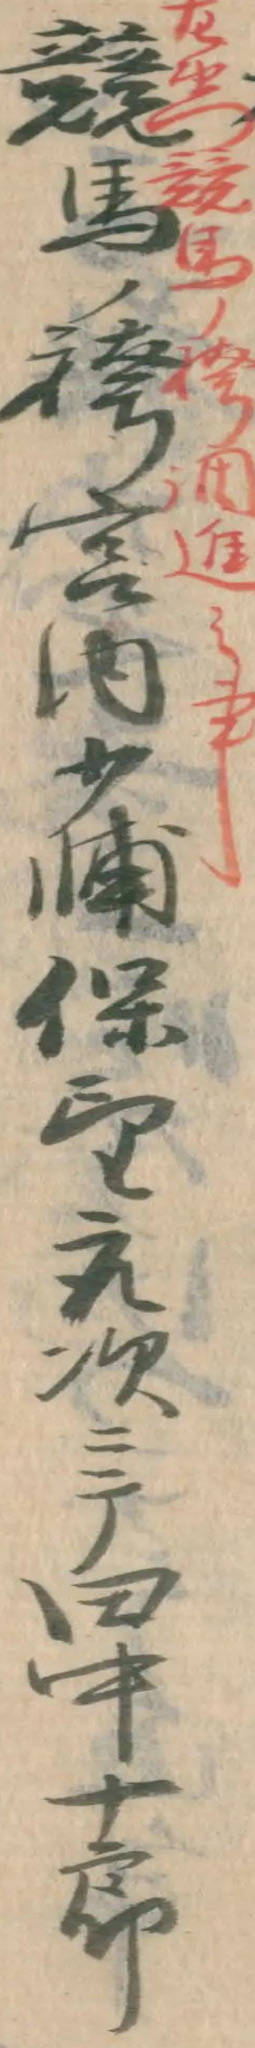競馬ノ袴宮内少輔保望取次ニテ田中十郎
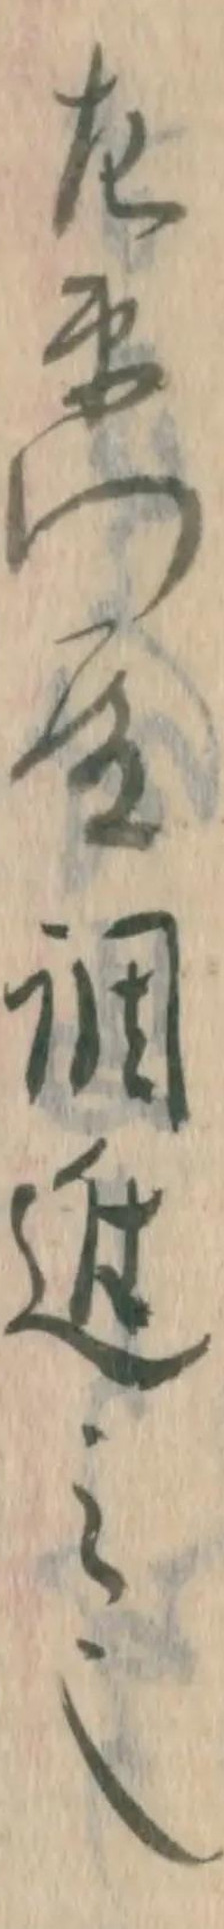左衛門殿調進之也
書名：賀茂社記録. 第10冊
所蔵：国立国会図書館 National Diet Library, JAPAN
